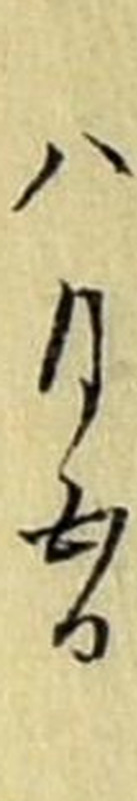八月五日

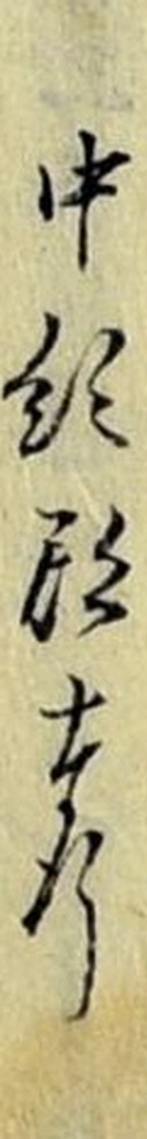中領郡奉行
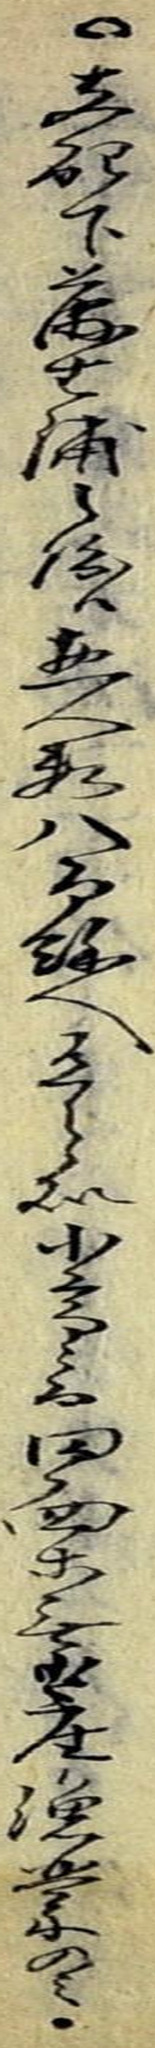○支配下蒲生浦之儀は惣人数八百餘人有之候処小高に而田面等無御座漁業のミ
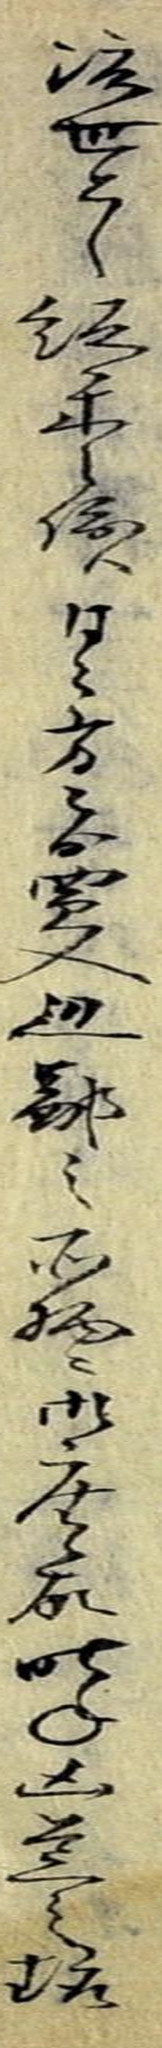渡世とし飯米之儀は日々方々ゟ買入辺鄙之所柄に御座候故昨年凶荒之趣
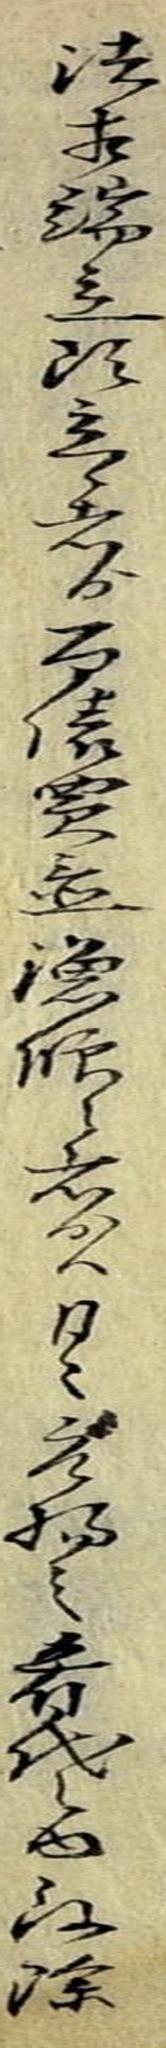法相端立頭立候者ゟ百俵買置漁師之者ゟは日々取揚之肴代之内致除
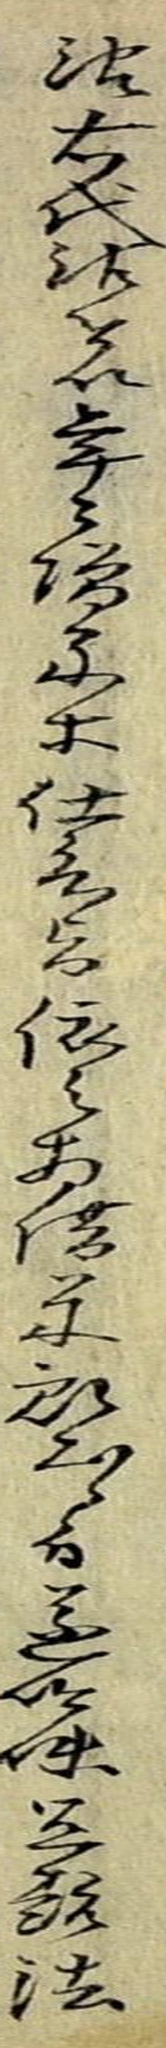銀右代銀を以年々増米等仕度旨依之拝借米願出候に付遂吟味宜趣法
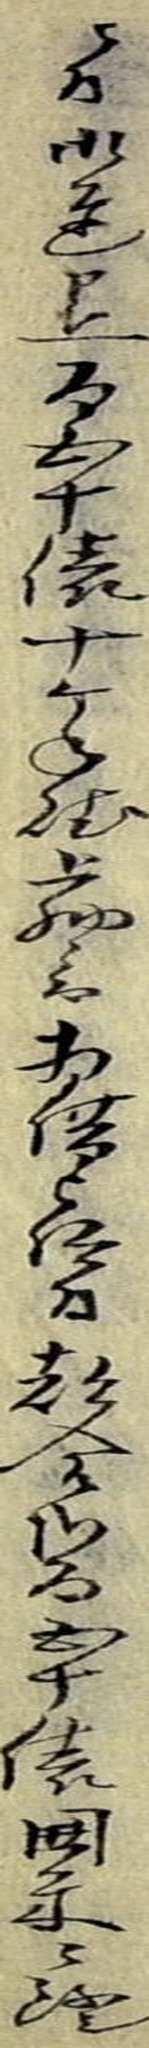に付御達申上百五十俵十ヶ年賦上納に而拝借被仰付都合弐百五十俵囲米に致し
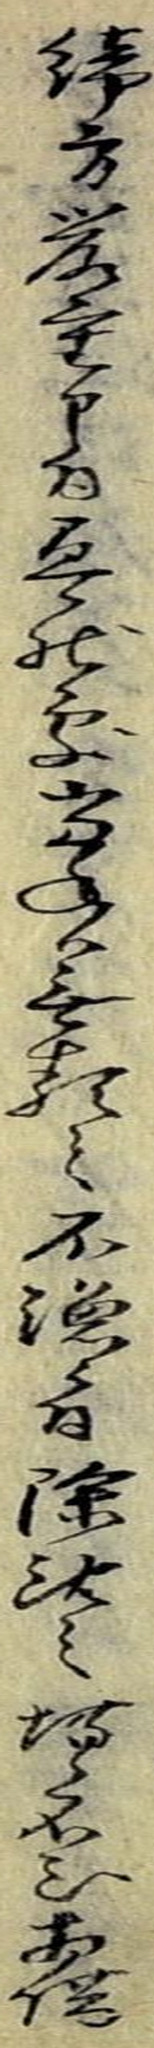締方厳重申付置候然処当年は無類之不漁に付除銀之場へ不至拝借
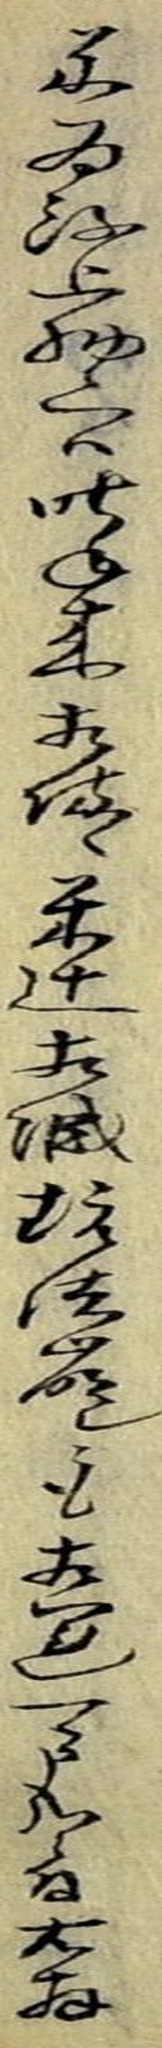米為致上納候へは昨年來相備候米辻相減趣法崩レにも相運可申哉に付右拝
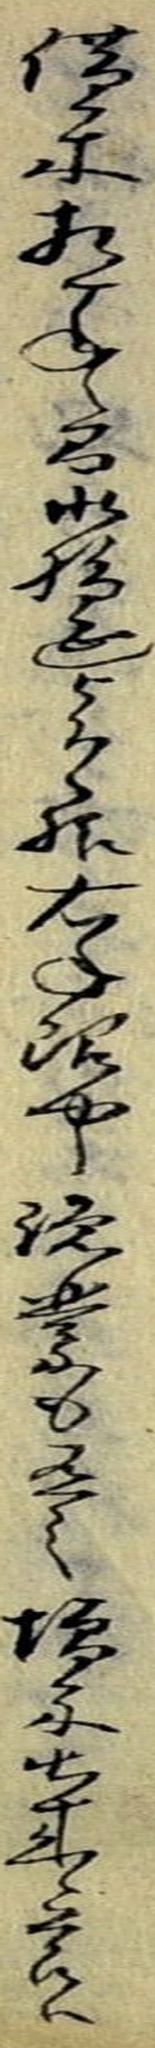借米拾ヶ年之間御指延被下候様右年限中漁業も有之増米出来候節は
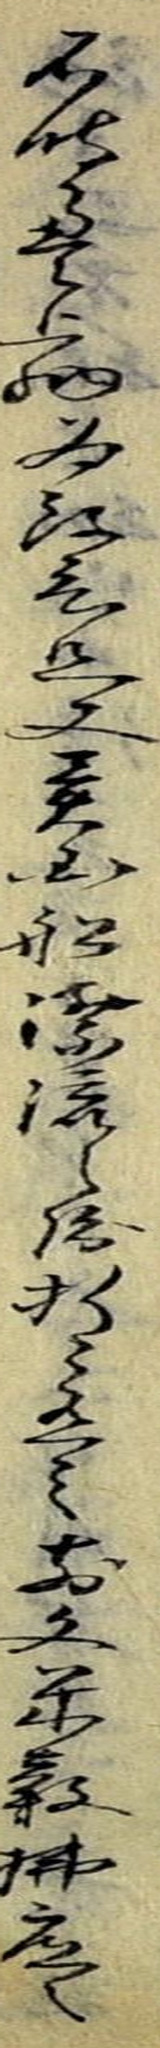不時畳々上納為致度且又異国船漂流之儀折々有之前文米穀払底之
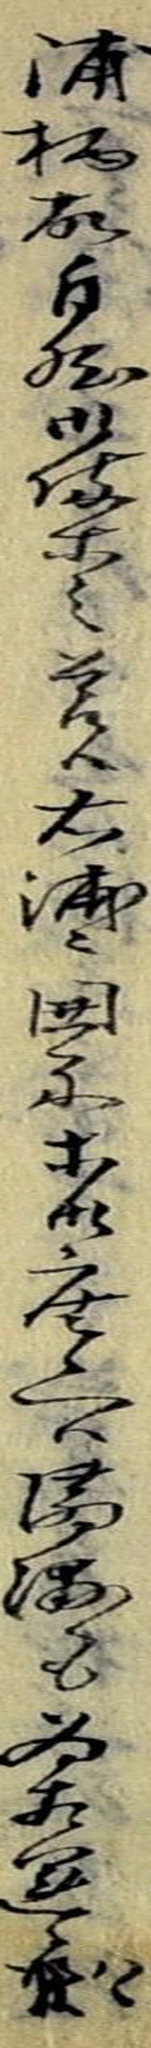浦柄故自然御備等之節は右浦々囲米等御座候へは満端にも為相運候はヽ
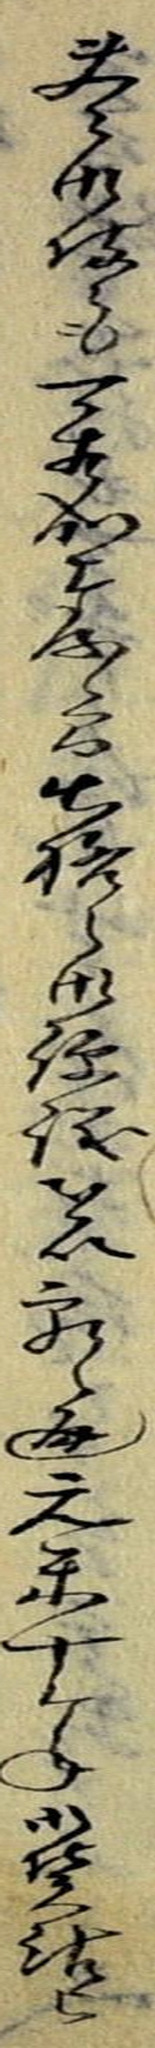夫々御備にも可相成奉存候間出格之御評議を以願之通元米十ヶ年御貸銀被
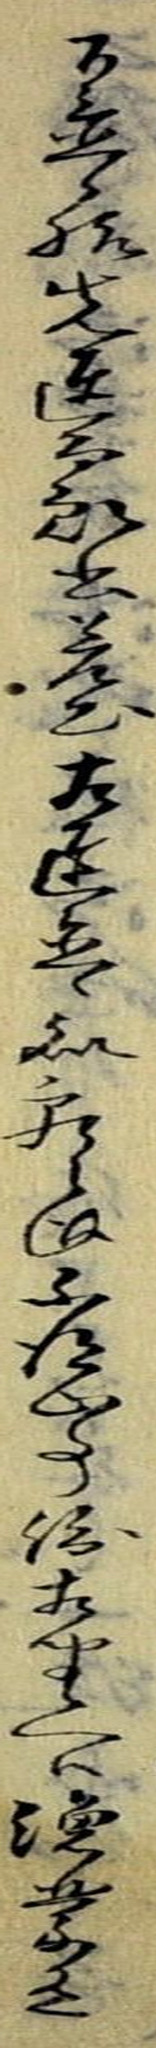下置候様先達而願書差出相達置候処願之趣不得止事儀相聞候へは漁業有
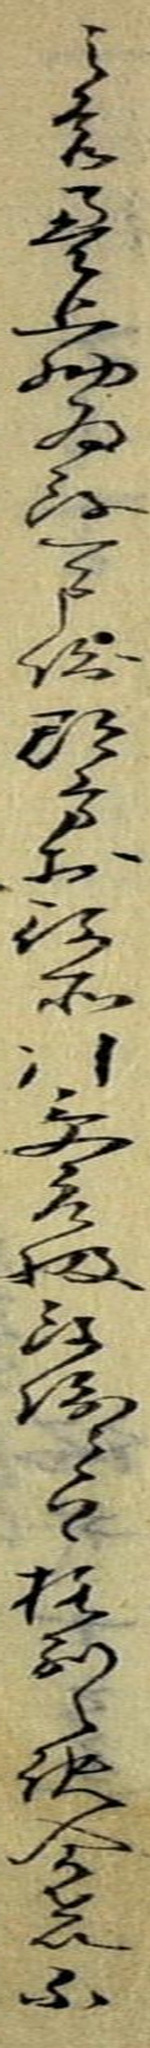之節畳々上納為致可申儀郡方於役所引受取扱致度候はヽ格別之訳合を以不
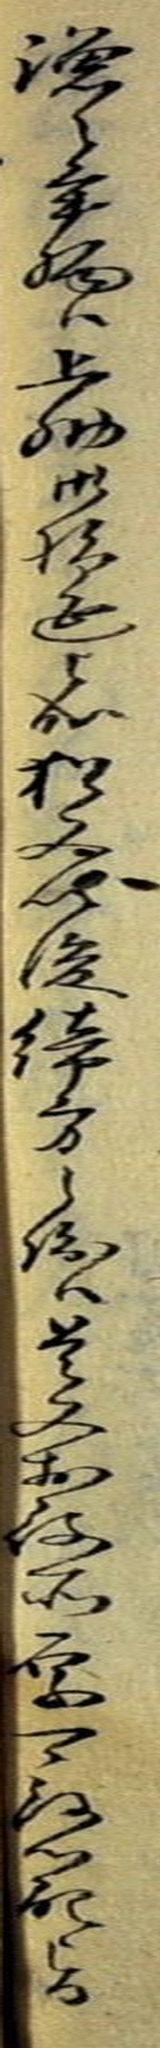漁之年柄は上納御指延被成猶又以後締方之儀は是又於役所厚可致心配旨
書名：命令之部 六
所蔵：福井県文書館 Fukui Prefectural Archives
